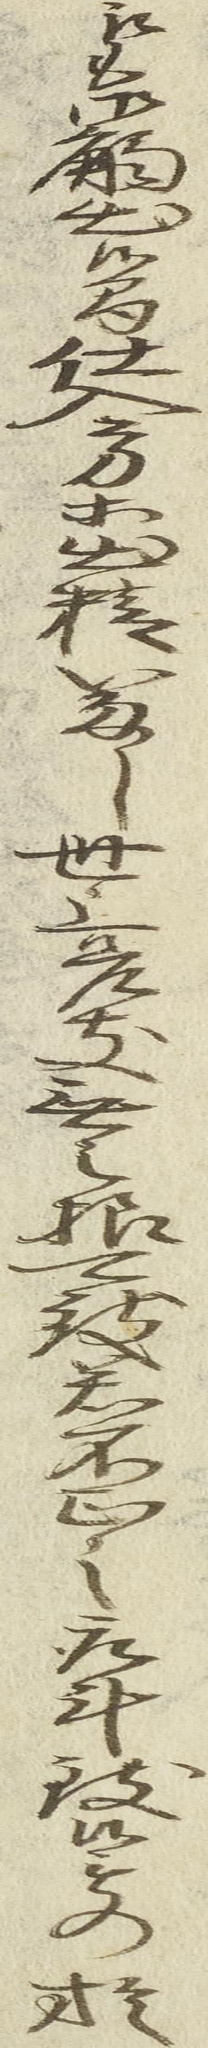江も御触出候間仕入方等出精いたし世上差支無之様可致若不正之取計致候もの於
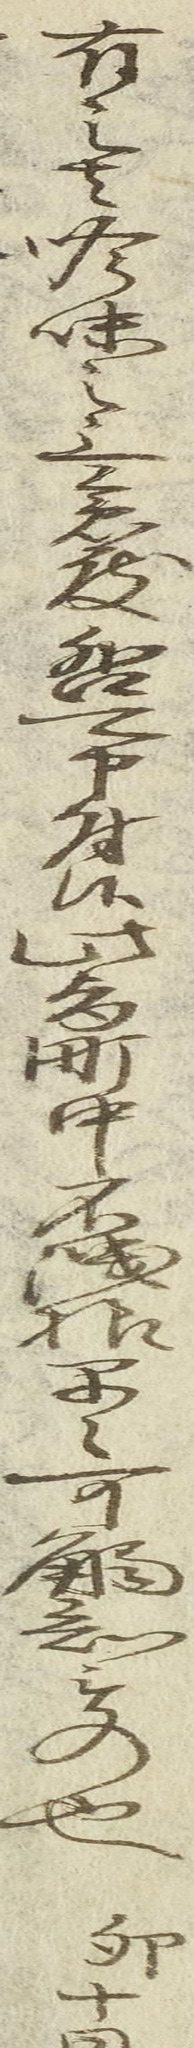有之者吟味之上急度咎可申付候此旨町中不洩様早々可触知もの也卯十月
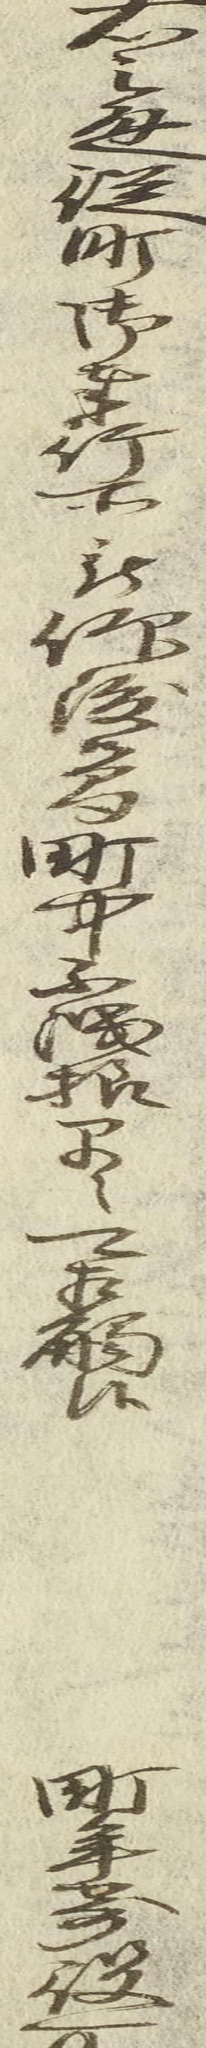右之通従町御奉行所被仰渡候間町中不洩様早々可相触候町年寄役所
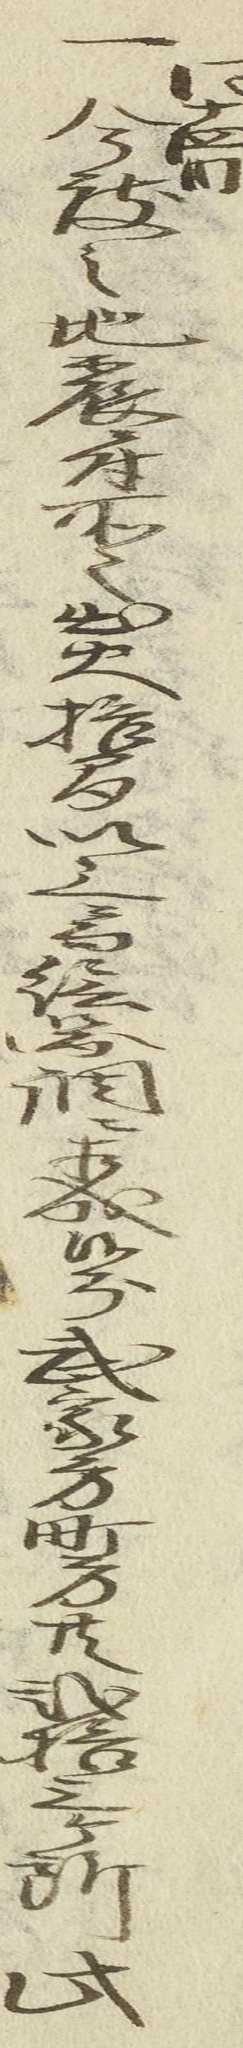一同十四日今度之地震ニ付所々出火拾間以上ニ而絵図調ニ相成候分武家方町方共弐拾三ケ所此
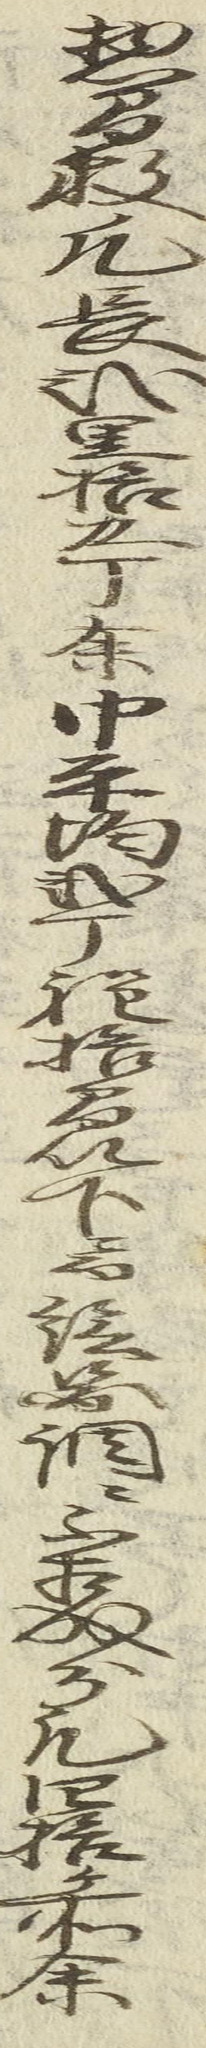惣間数凡長弐里拾九丁余巾平均弐丁程拾間以下ニ而絵図調ニ不相成分凡四拾ケ所余
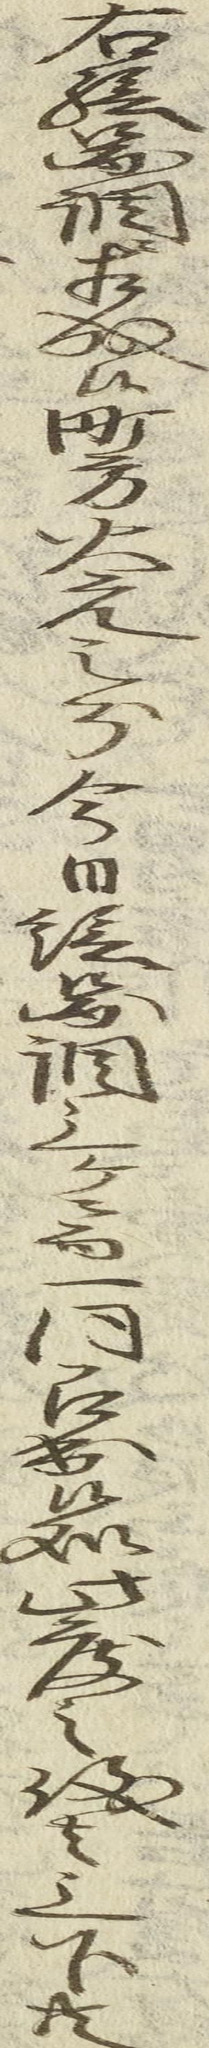右絵図調ニ相成候町方火元之分今日絵図調上ケニ而一同召出候処此度之儀者上下共
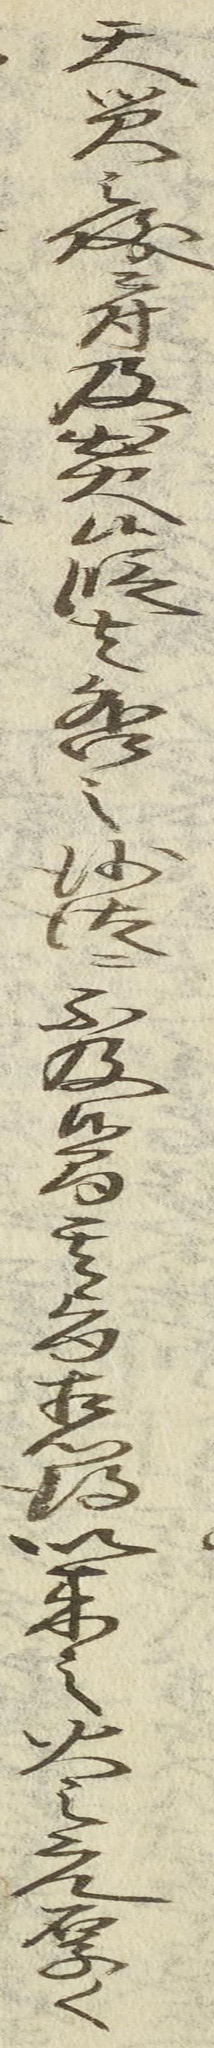天災之儀ニ付及出火候段者咎之沙汰ニ不及候間其旨相心得以来之火之元厚く
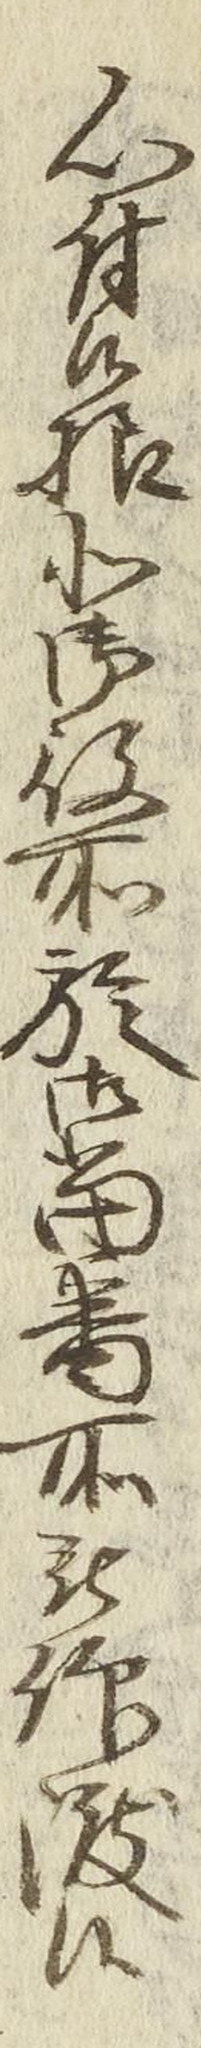心付候様北御役所於御当番所被仰渡候
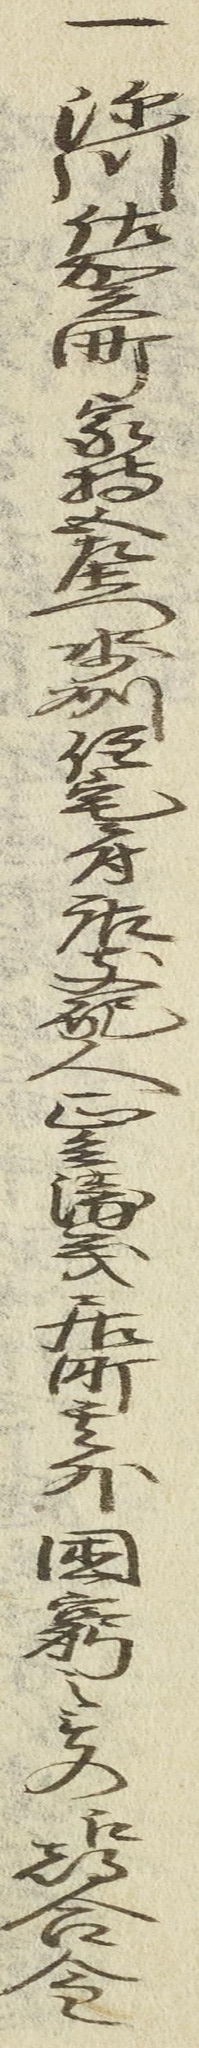一深川佐賀町家持五左衛門勢州住宅ニ付店支配人正兵衛義居町其外困窮之もの江都合金
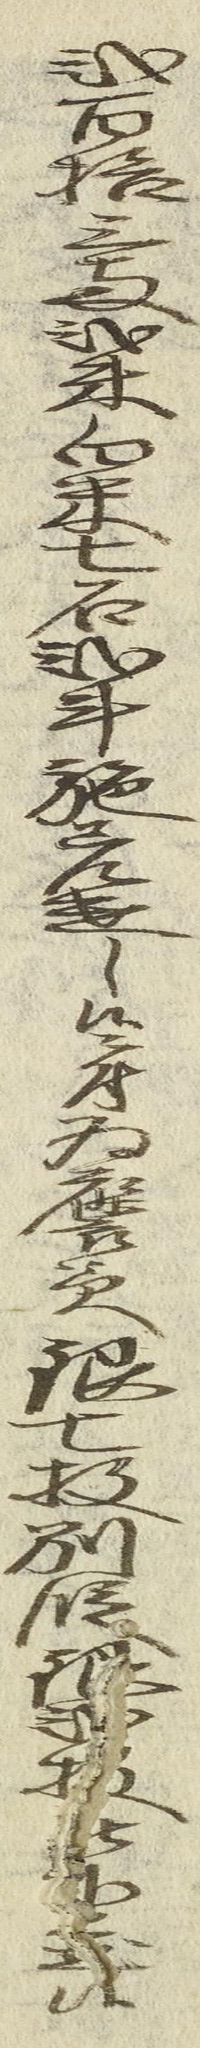弐百拾三両弐朱白米七石弐斗施差遣し候ニ付為褒美銀七枚別段銀弐枚被下置候
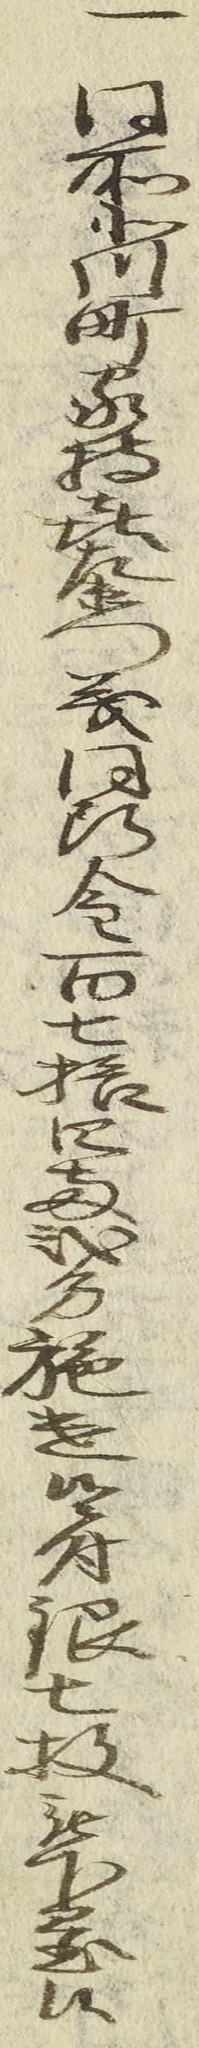一同所北川町家持喜左衛門義同断金百七拾四両弐分施遣候ニ付銀七枚被下置候
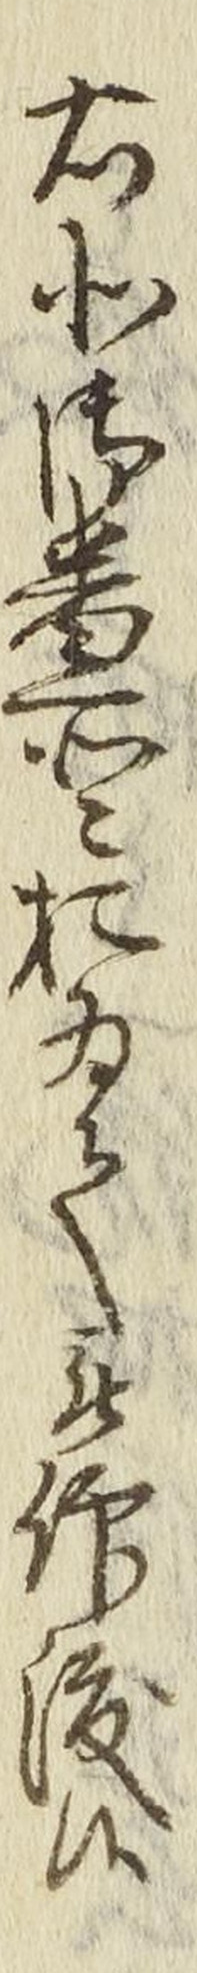右北御番所ニ於ゐて被仰渡候
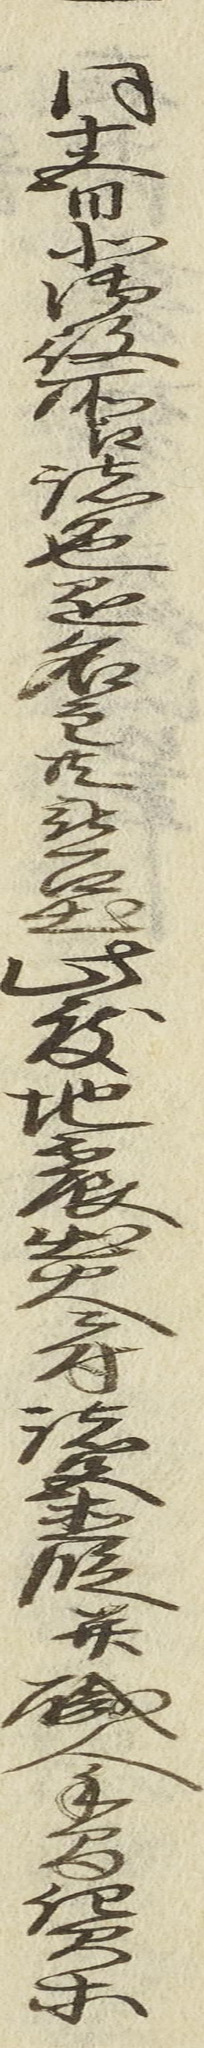一同十五日北御役所江諸色懸名主共被召出此度地震出火ニ付諸色直段幷職人手間賃等
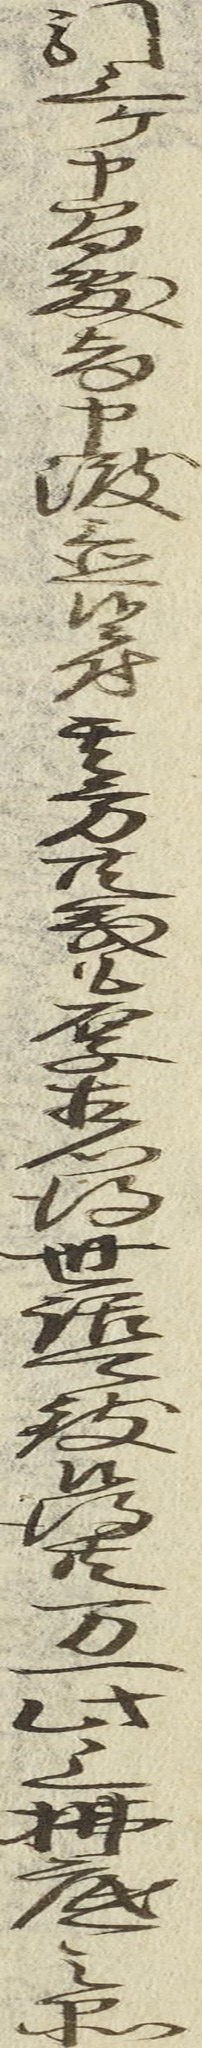引上ケ間敷旨申渡置候ニ付其方共義も厚相心得世話可致候得共万一此上払底之品
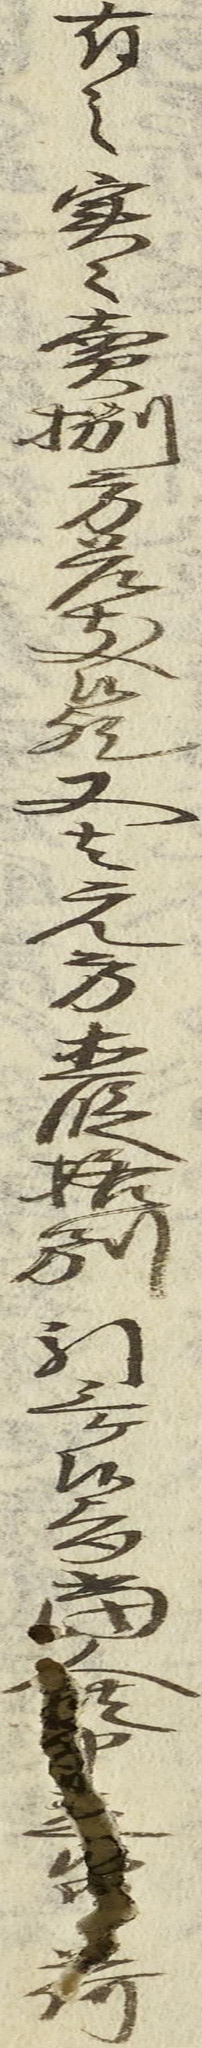有之実々売捌方差支候歟又者元方直段格別引上ケ候旨当人共申定候而荷
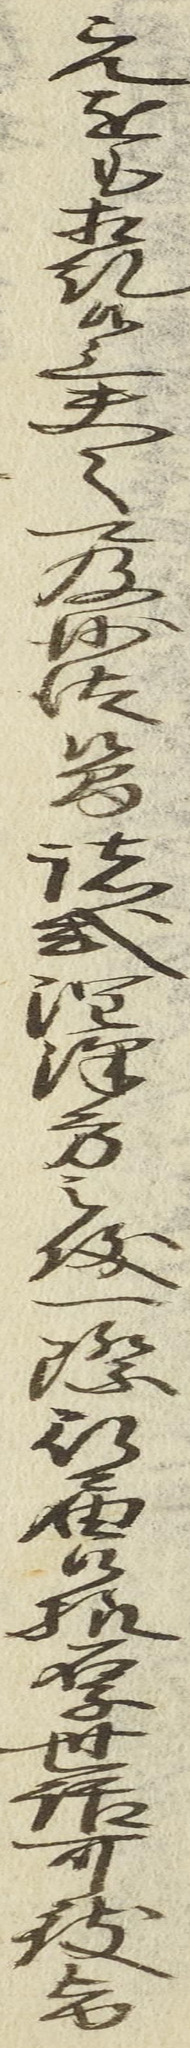元をも相糺候上夫々可及沙汰候間諸式潤沢方之儀一際行届候様厚世話可致旨
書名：安政二年震災記事　完
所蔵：東京大学地震研究所図書室 Earthquake Research Institute Library, The University of Tokyo, JAPAN
